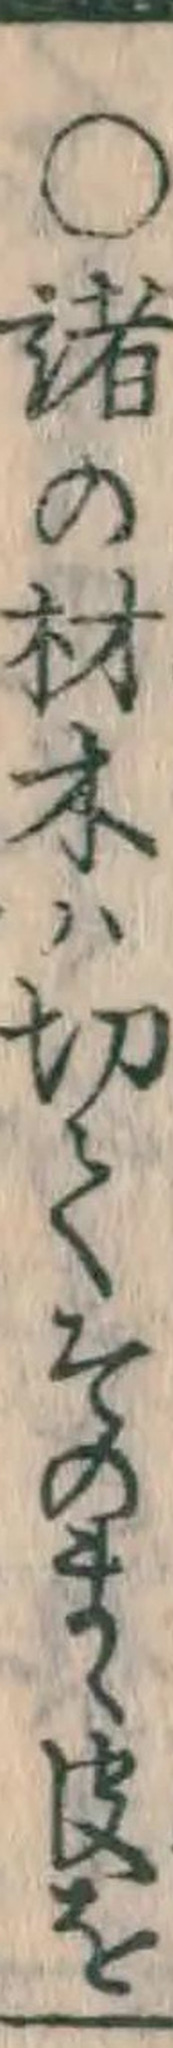○諸の材木は切てそのまま皮を
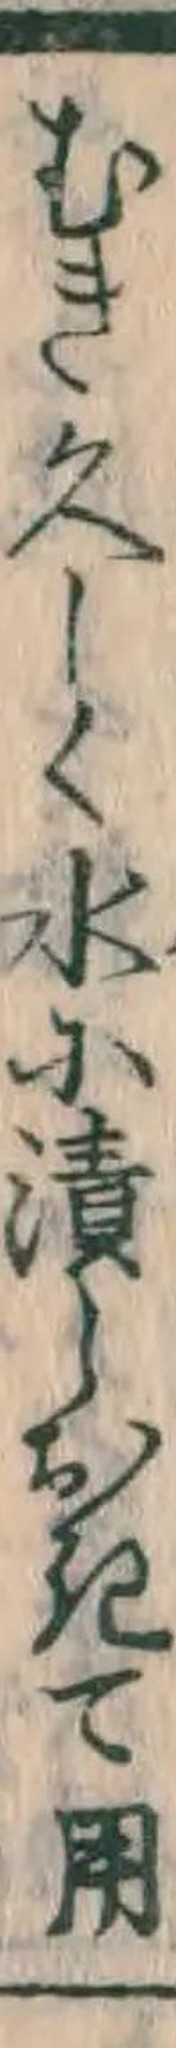むき久しく水に漬しおきて用
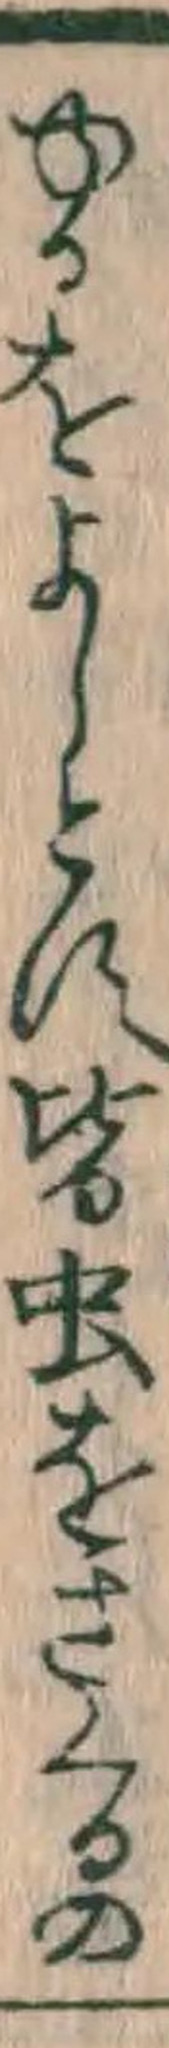ゆるをよしとす皆虫をさくるの
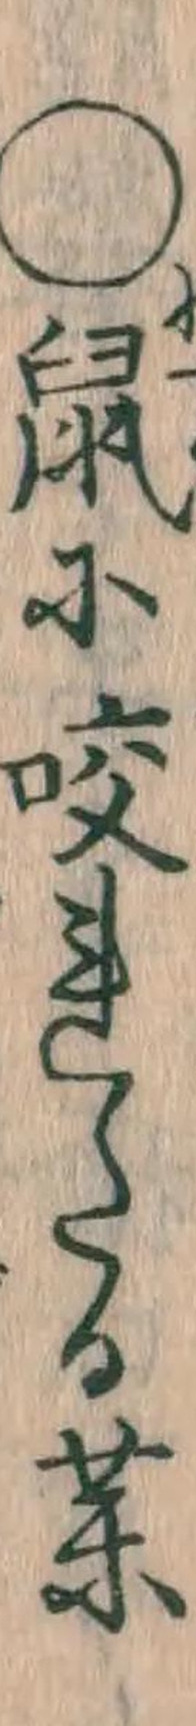○鼠に咬れたる薬
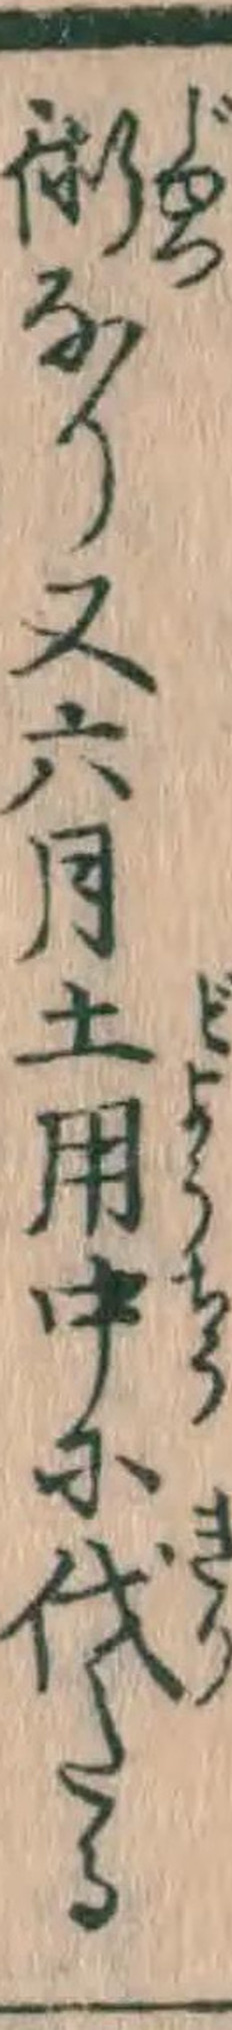術なり又六月土用中に伐たる
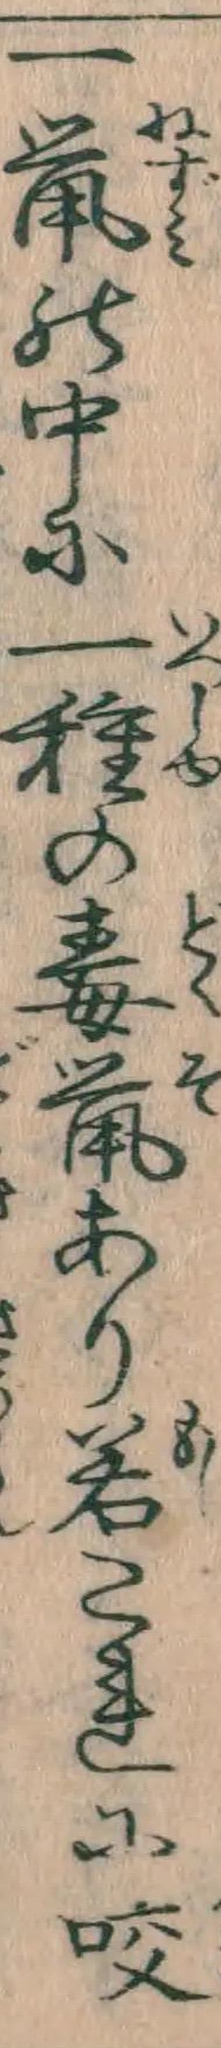一鼠の中に一種の毒鼠あり若これに咬
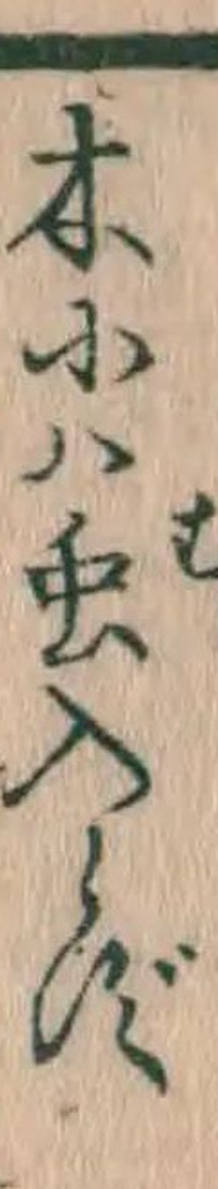木には虫入らず
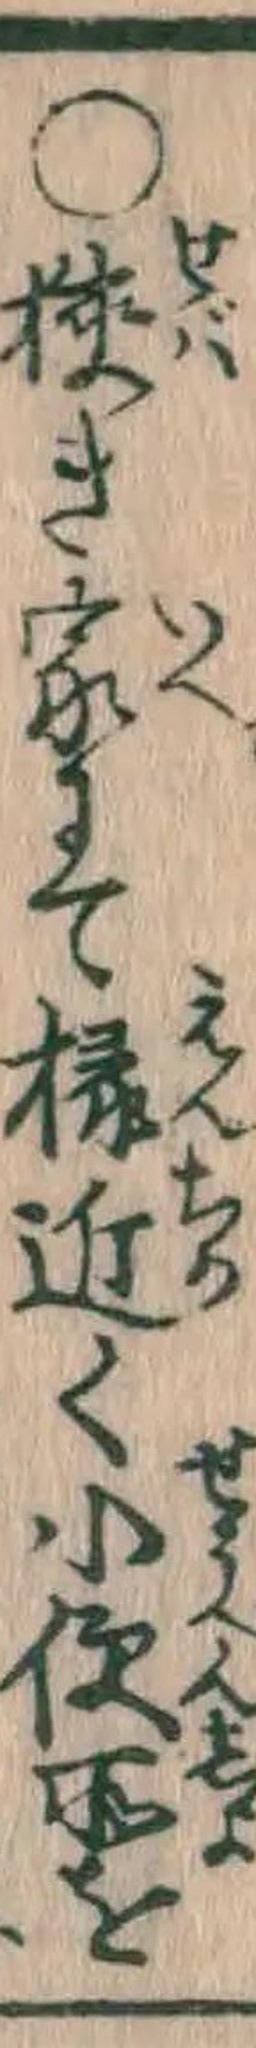○狭き家にて椽近く小便所を
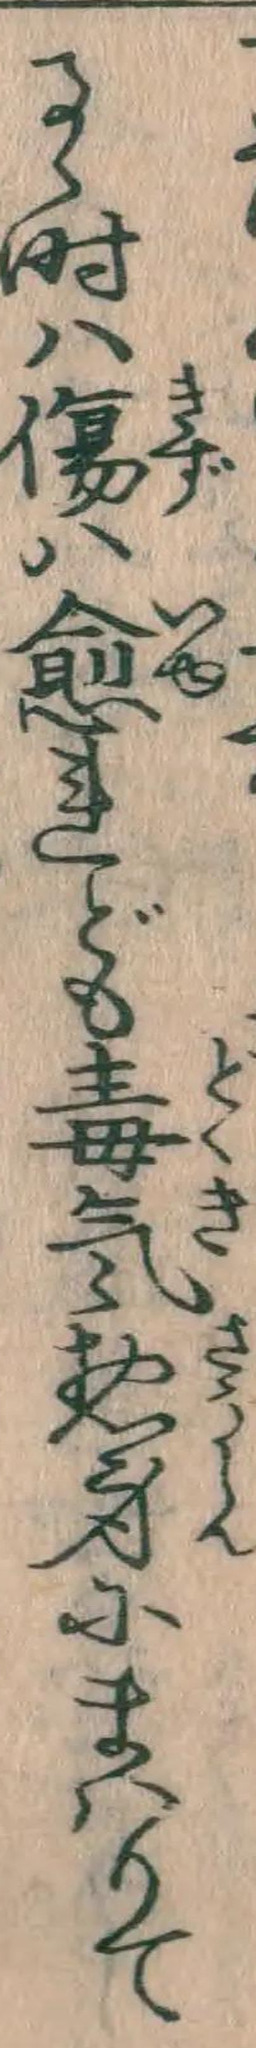るゝ時は傷は愈れども毒気惣身にまはりて
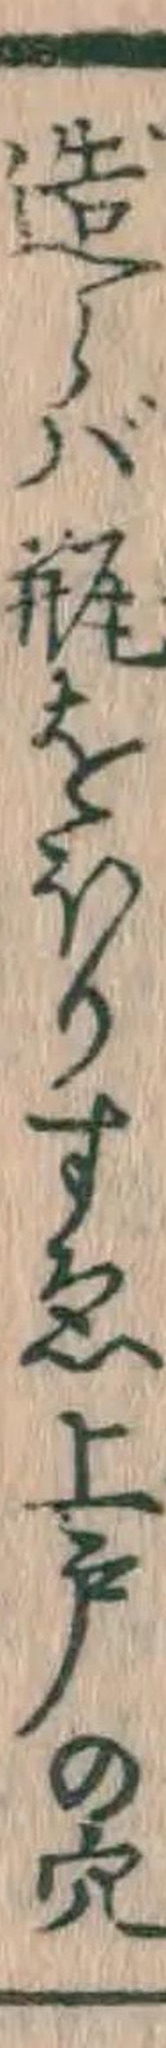造らば瓶をほりすゑ上戸の穴
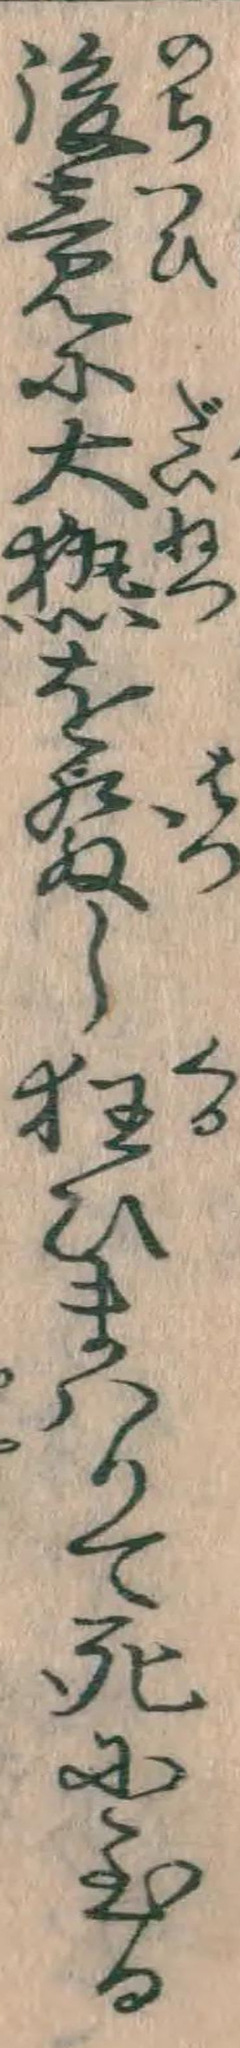後竟に大熱を発し狂ひまはりて死に至る
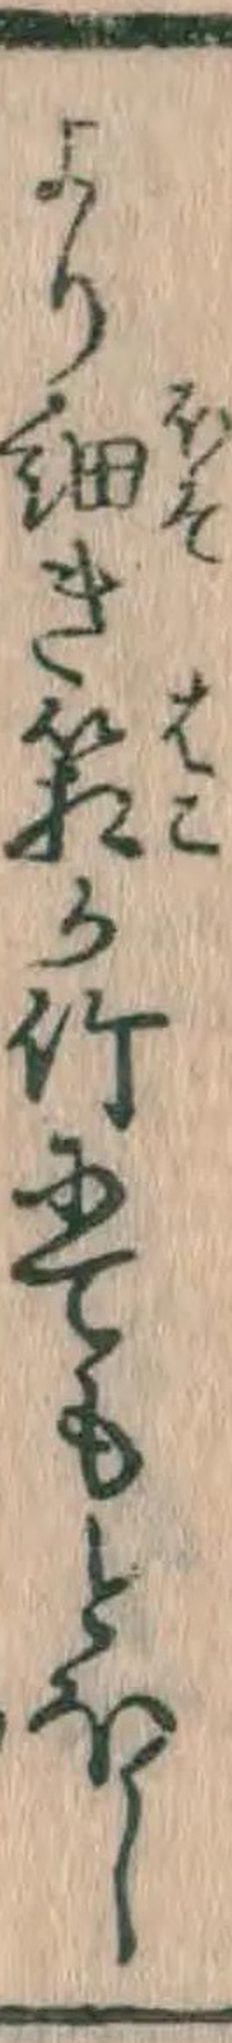より細き箱か竹にてもとほし
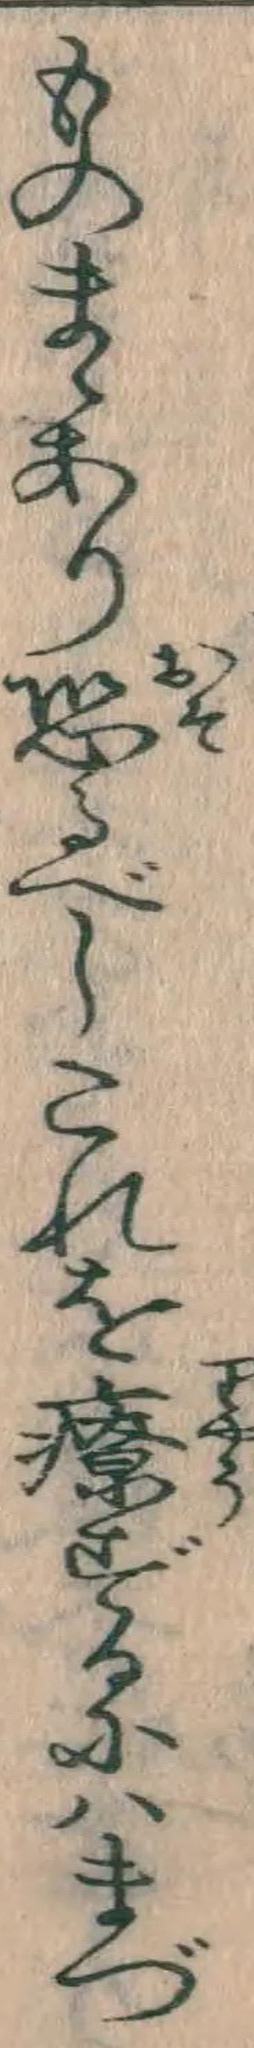ものまゝあり恐るべしこれを療ずるにはまづ
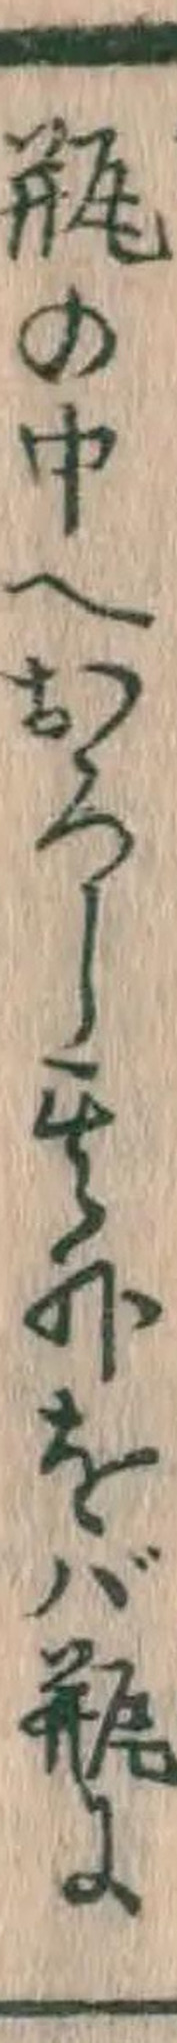瓶の中へおろし其外をば瓶に
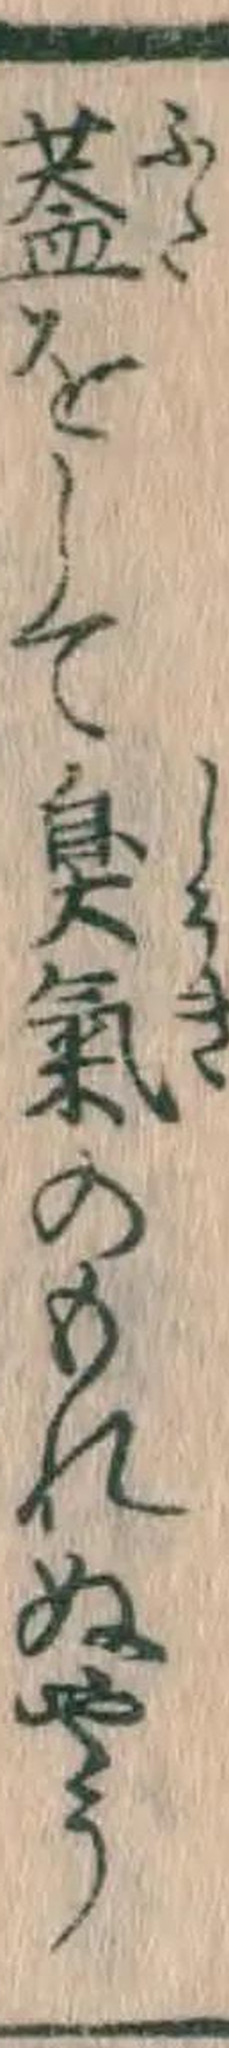蓋をして臭気のもれぬやう
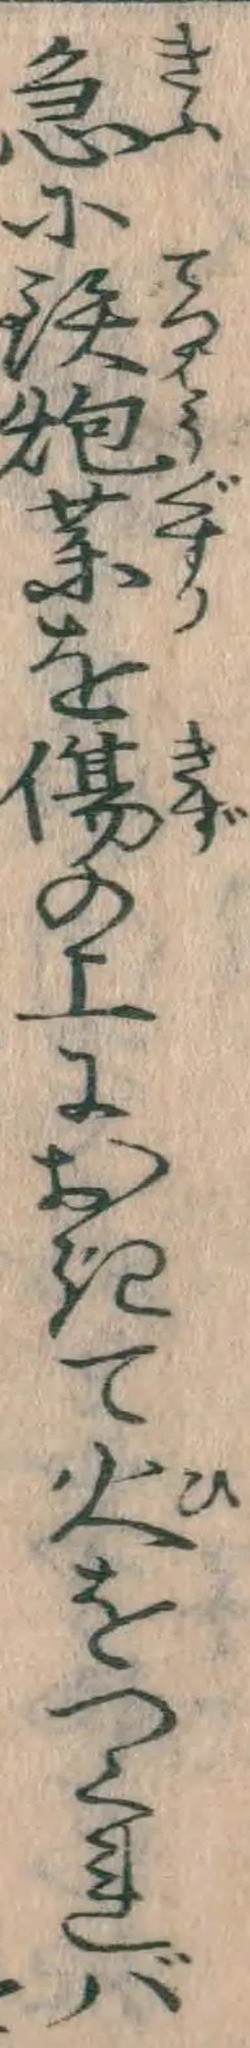急に鉄砲薬を傷の上におきて火をつくれば
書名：広益秘事大全 3巻. [3]
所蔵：国立国会図書館 National Diet Library, JAPAN
